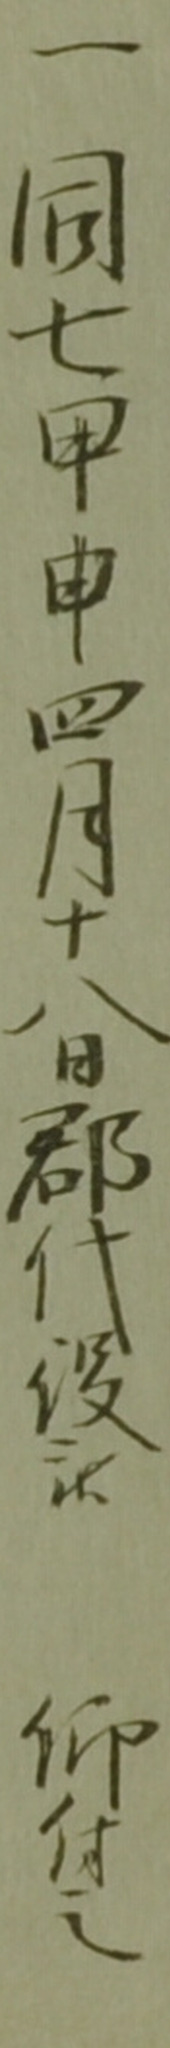一同七甲申四月十八日郡代役被仰付
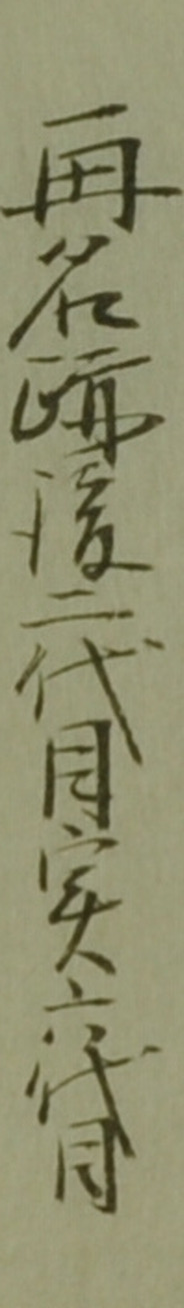再名跡後二代目実六代目
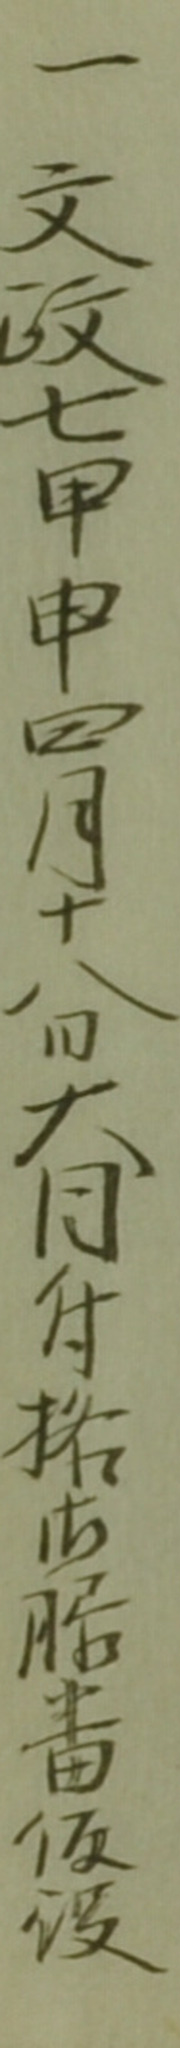一文政七甲申四月十八日大目付格御膳番仮役
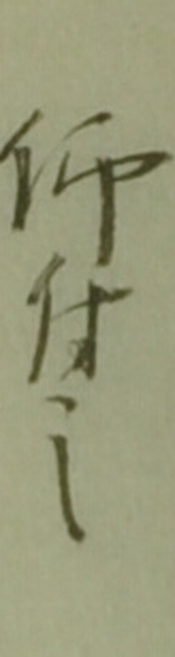仰付之
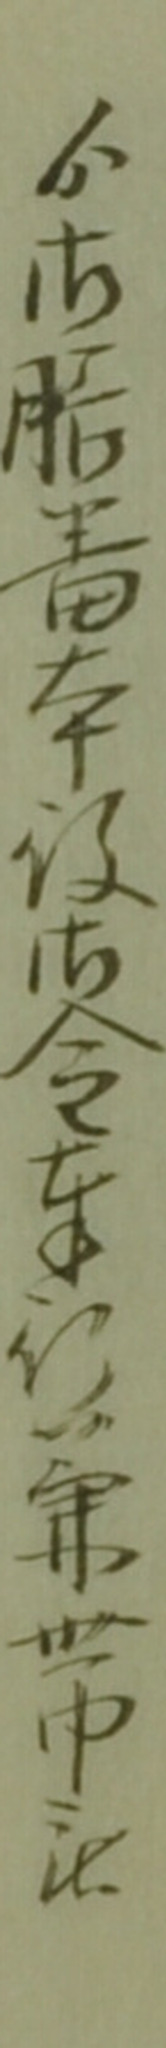ゟ御膳番本役御金奉行兼帯被
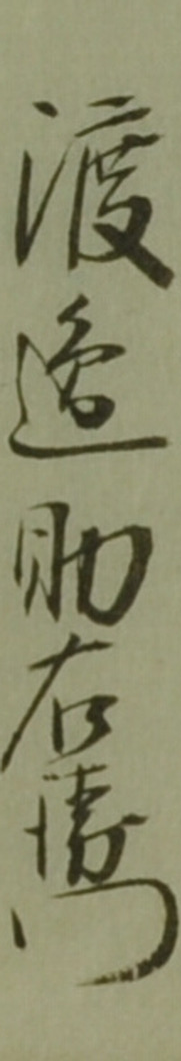渡邊助右衛門
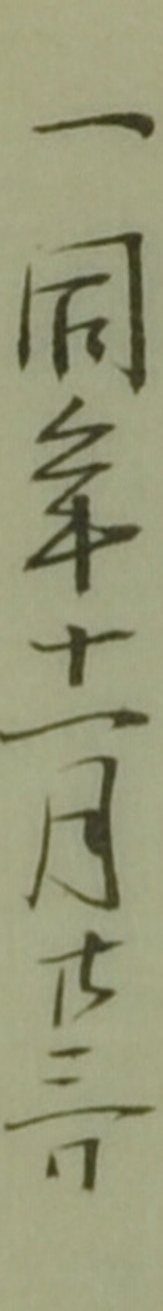一同年十一月廿三日
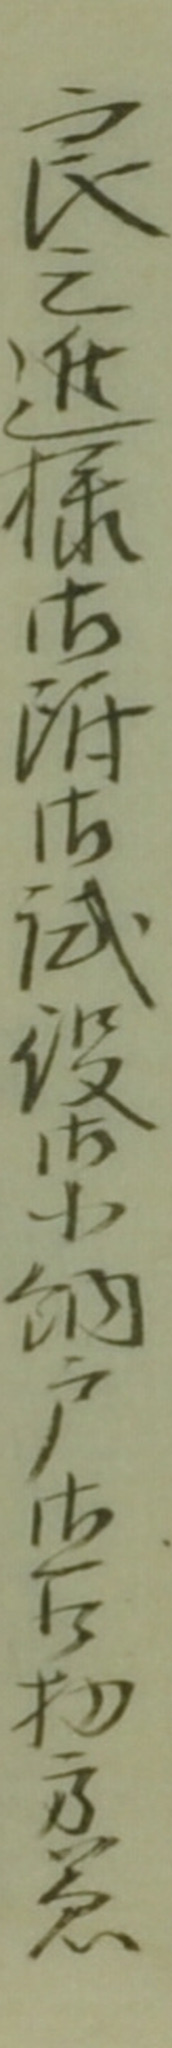良之進様御附御試役御小納戸御召物方兼
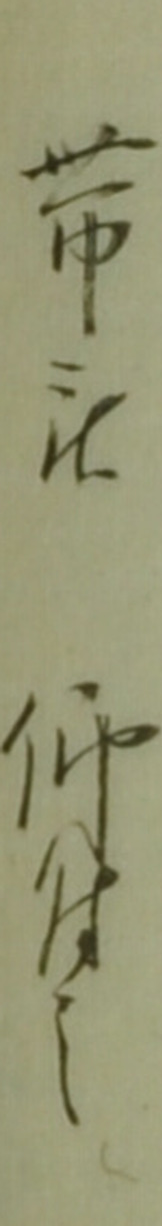帯被仰付之
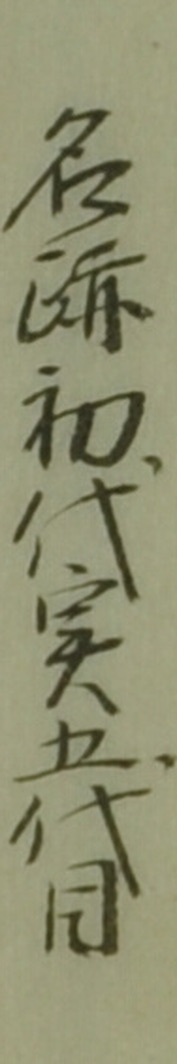名跡初代実五代目
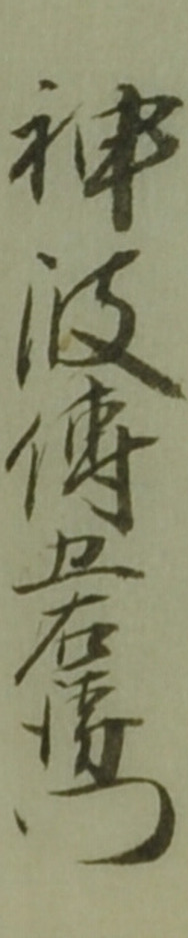神波伝五右衛門
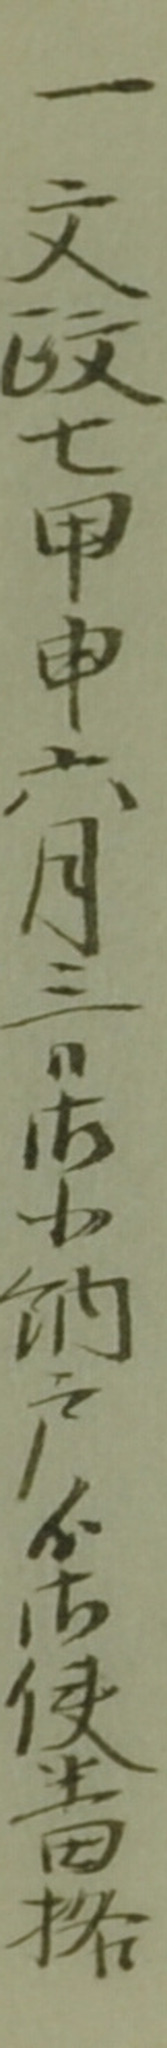一文政七甲申六月三日御小納戸ゟ御使番格
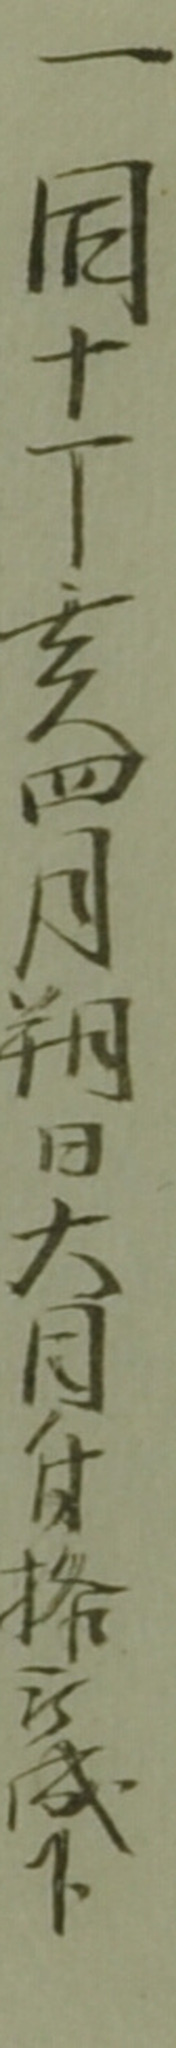一同十丁亥四月朔日大目付格被成下
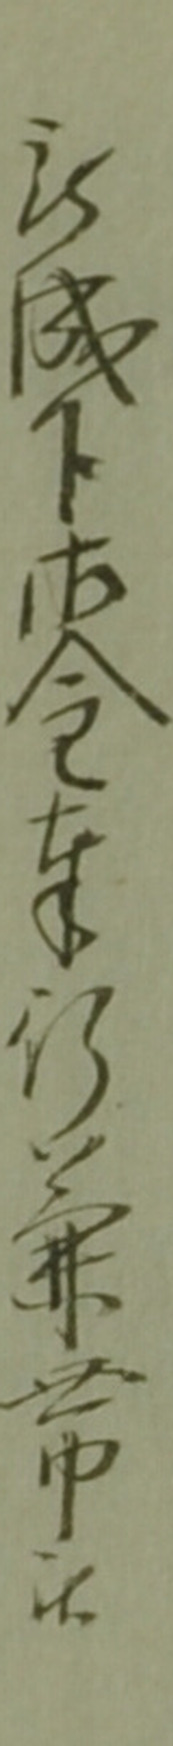被成下御金奉行兼帯被
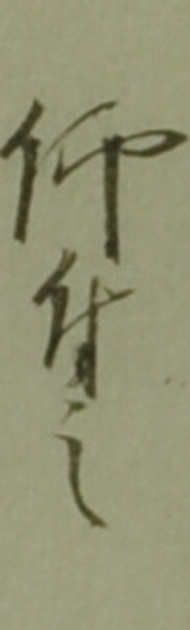仰付之
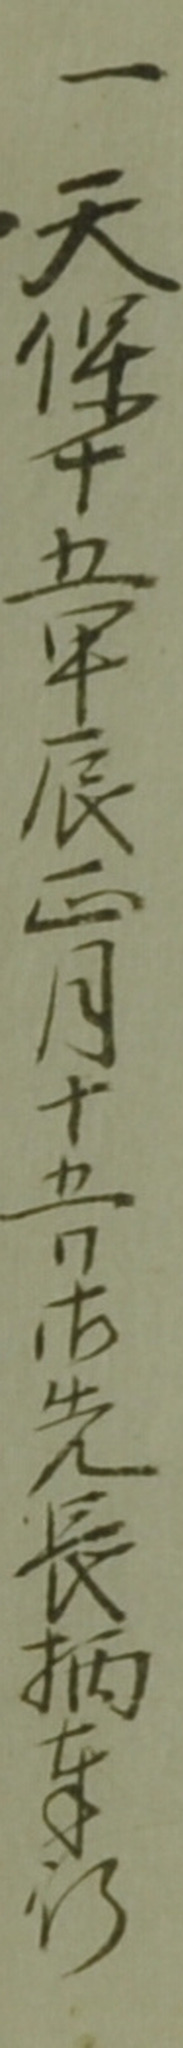一天保十五甲辰正月十五日御先長柄奉行
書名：諸御役代々録（七）
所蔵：伊那市立高遠町図書館・合同会社AMANE
